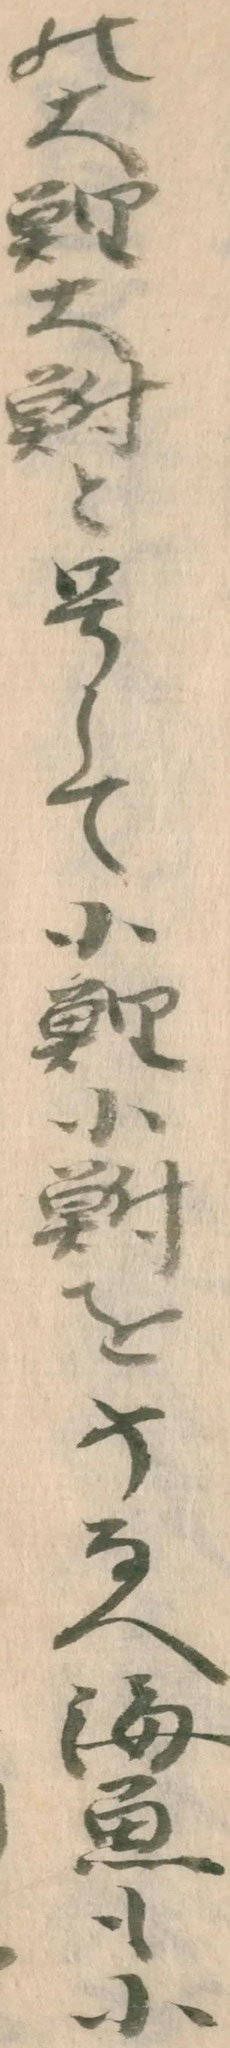の大鯉大鮒と号して小鯉小鮒をそなへ海魚も小
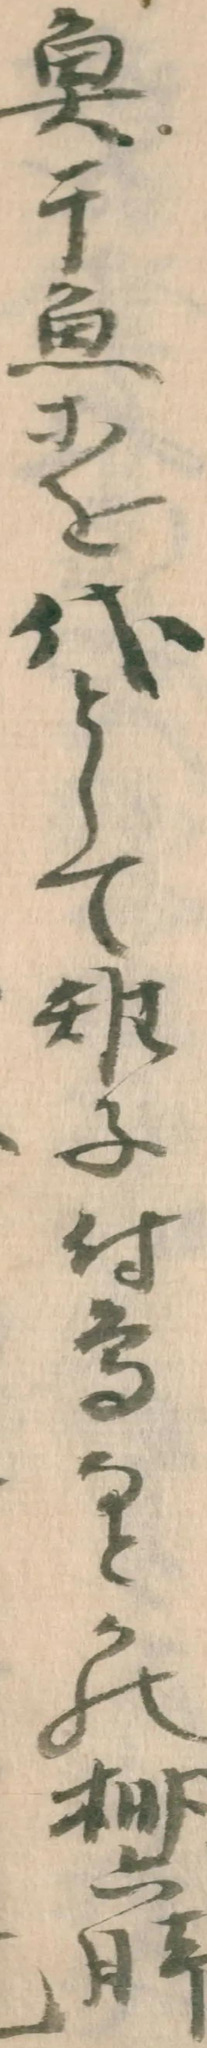魚干魚等を代として雉子付鳥なとかの棚六脚
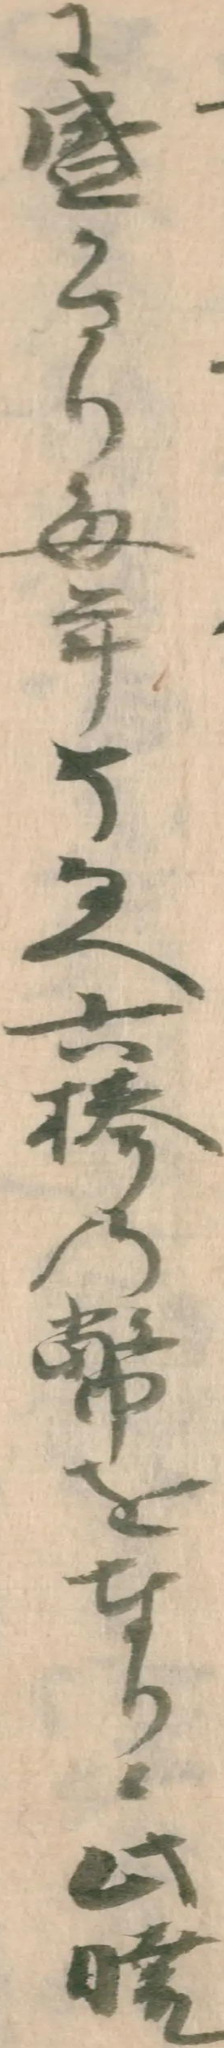に盛かさり毎年そなへ六棒の幣を奉り候此暁
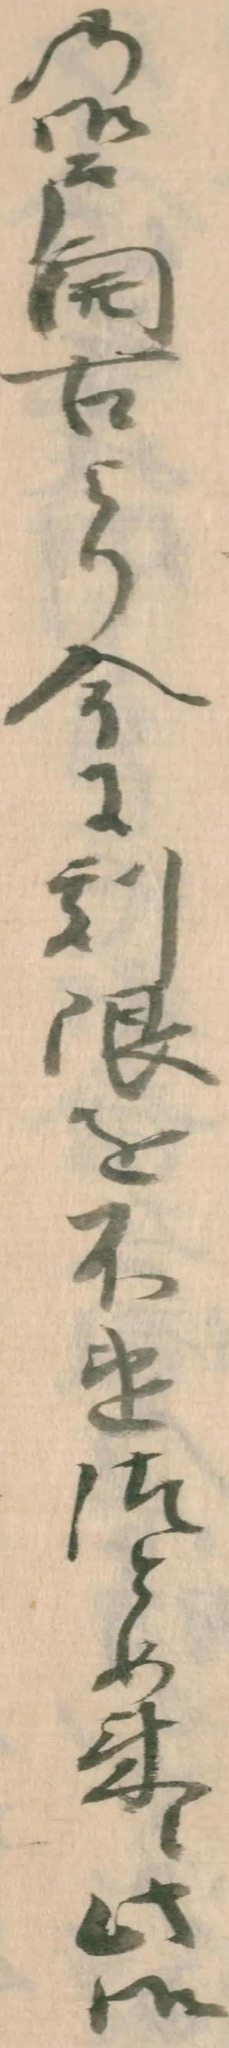の御戸開古より今に刻限を不違つとめ来候此御
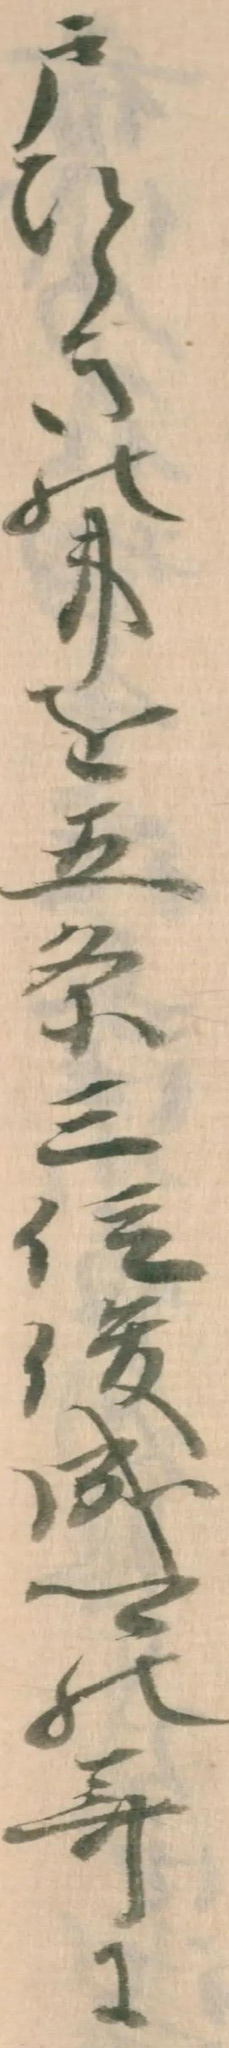戸ひらきの事を五条三位俊成卿の哥に
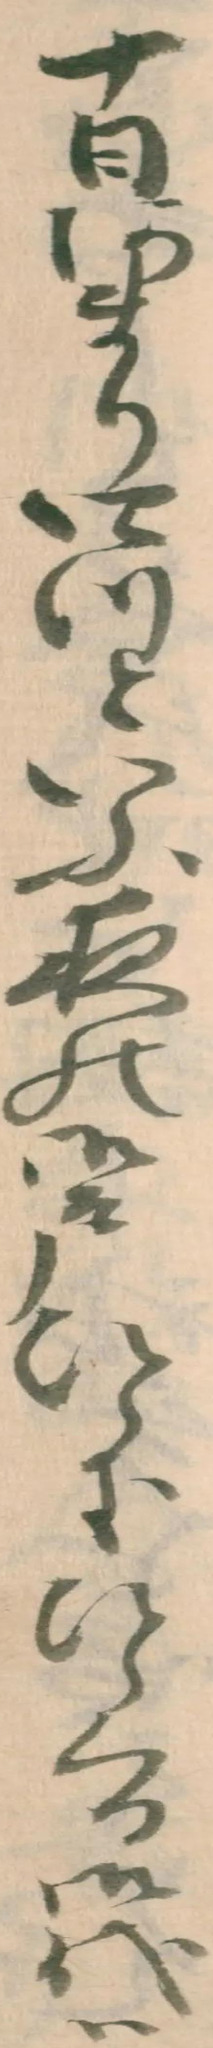十日あまり四つといふ夜の御戸ひらきひらくる御代は
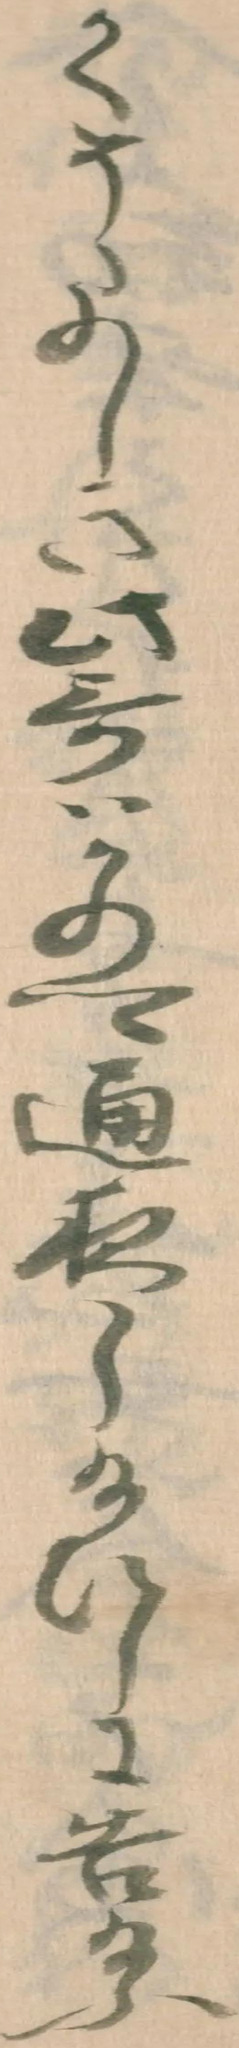かくそたのしき此哥はかの卿通夜し給ひしに告給ふ
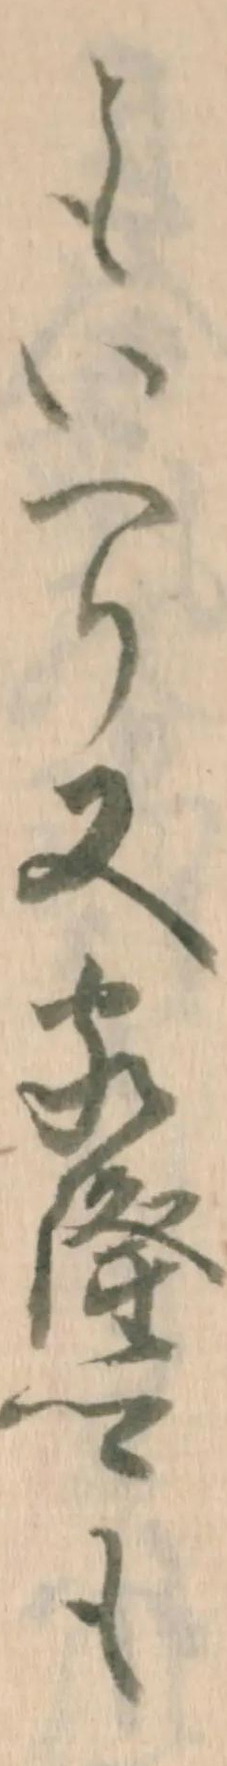ともいへり又家隆卿も
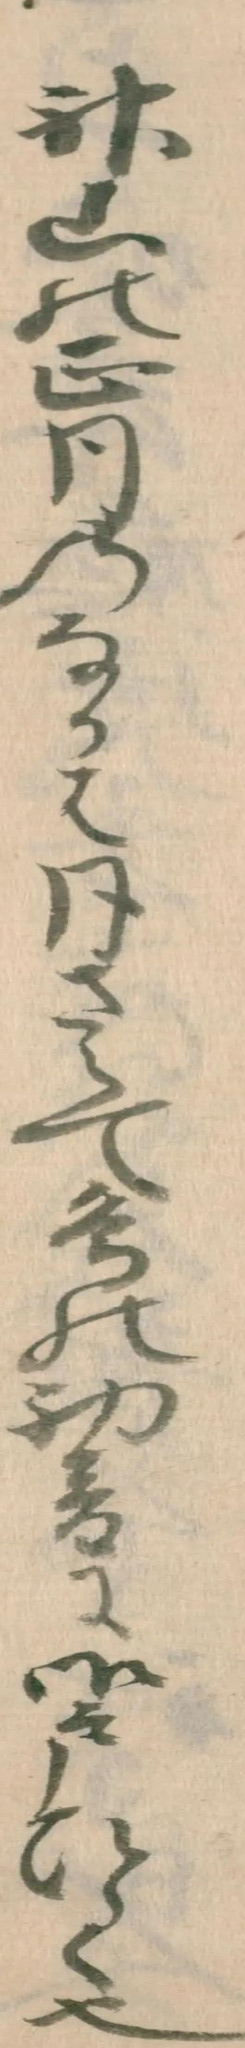神山の正月のなかは月さえて鳥の初音に御戸ひらく也
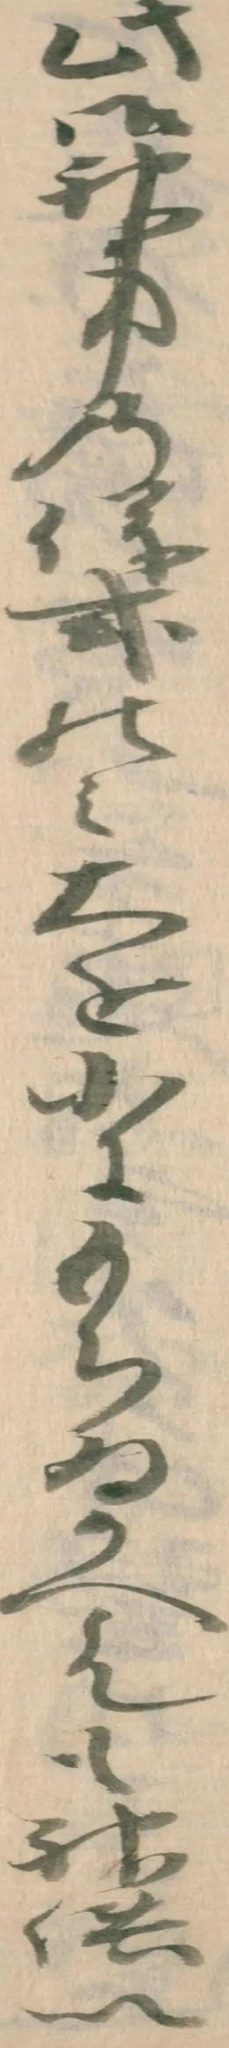此御神事の儀式のみ大を小にもちゐかへ候ても神供以
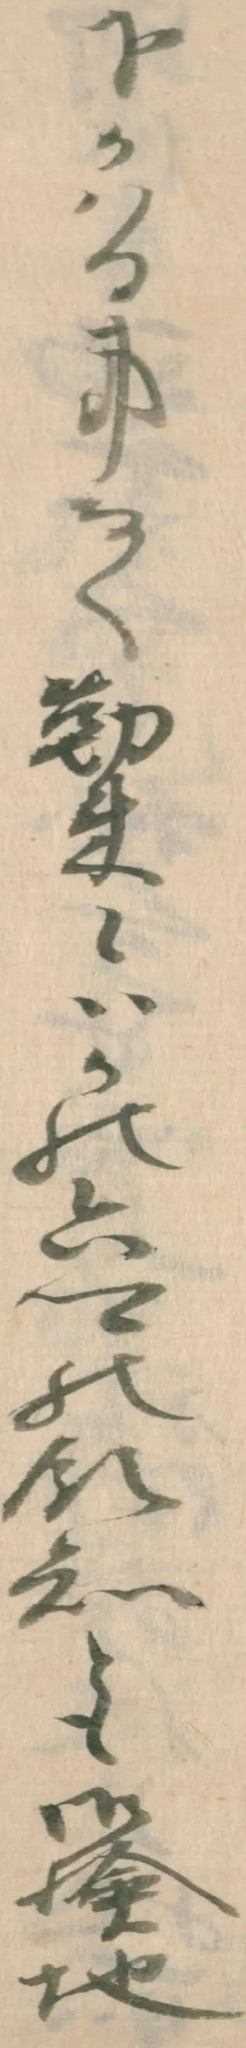下かはる事なく勤来候はかの六郷の領知とも御検地
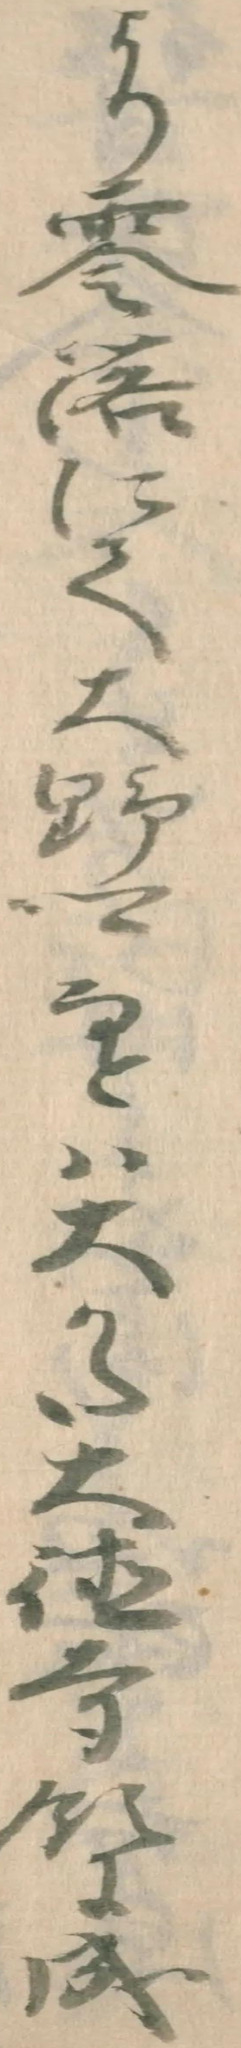より零落にて大野郷なとは大かた大徳寺領に成
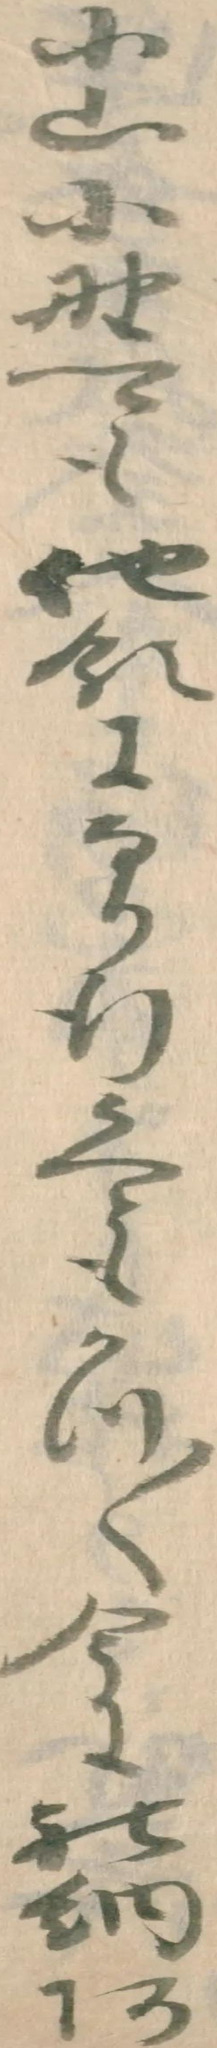小山小野郷も他領になり行候へともかつ〳〵今に社納あ
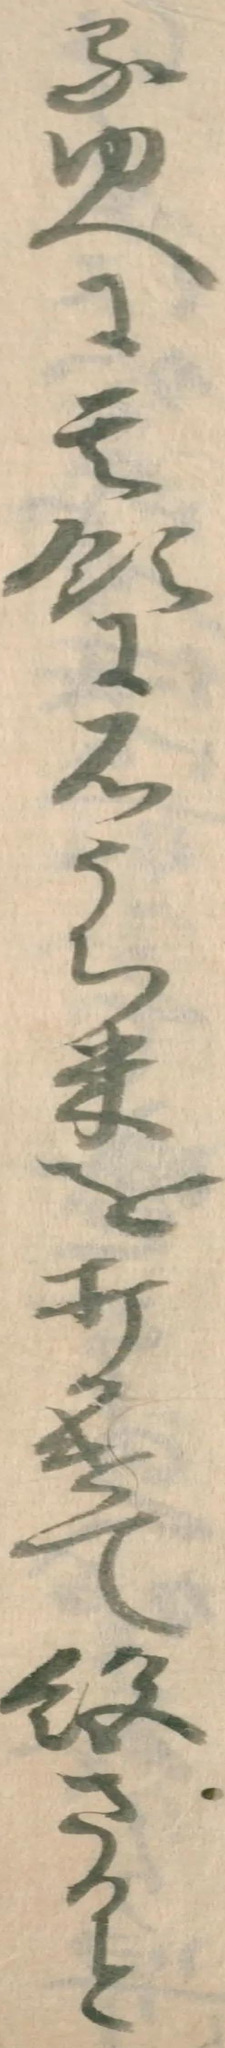るゆへに其領に石うち米を打かけて絶さると
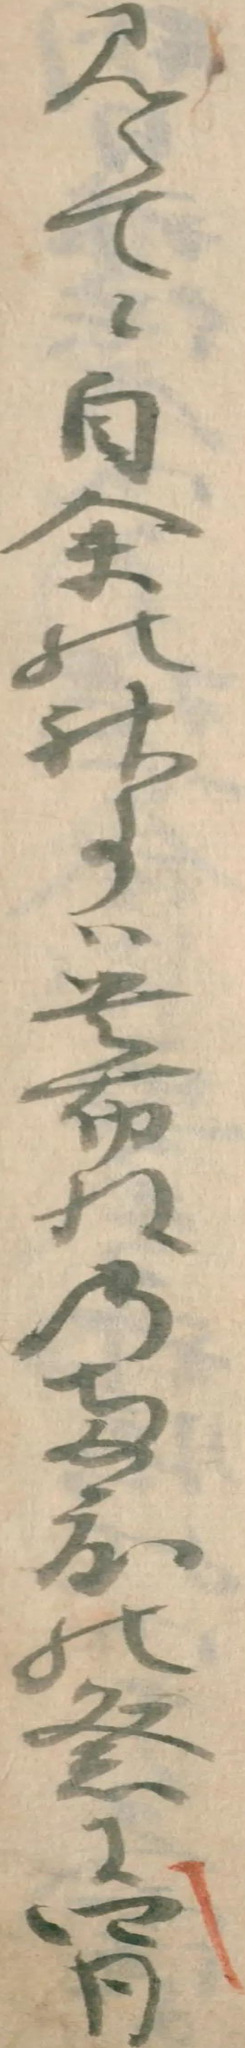見えて候自余の神事は貴ふねの両度の祭に四月

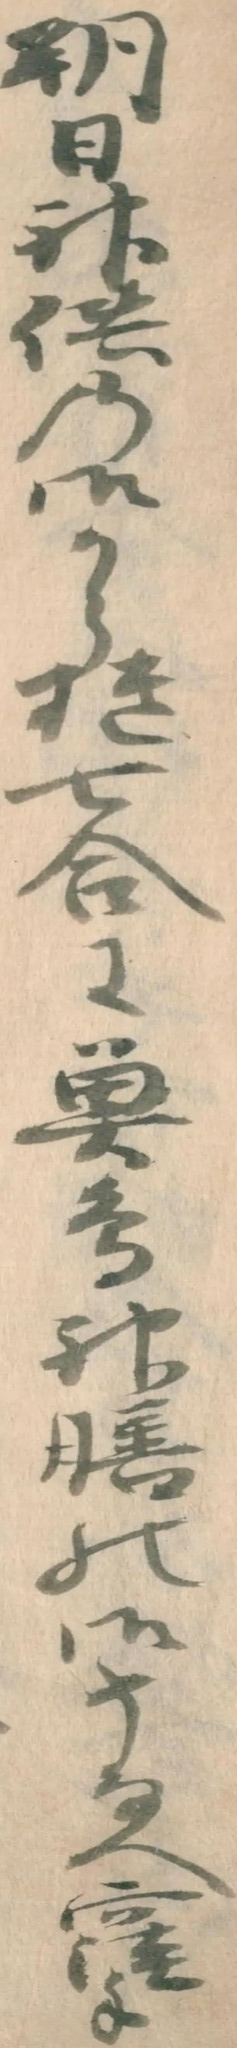朔日神供の御から櫃七合に魚鳥神膳の御そなへ窪手
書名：賀茂社記録. 第1冊
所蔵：国立国会図書館 National Diet Library, JAPAN
